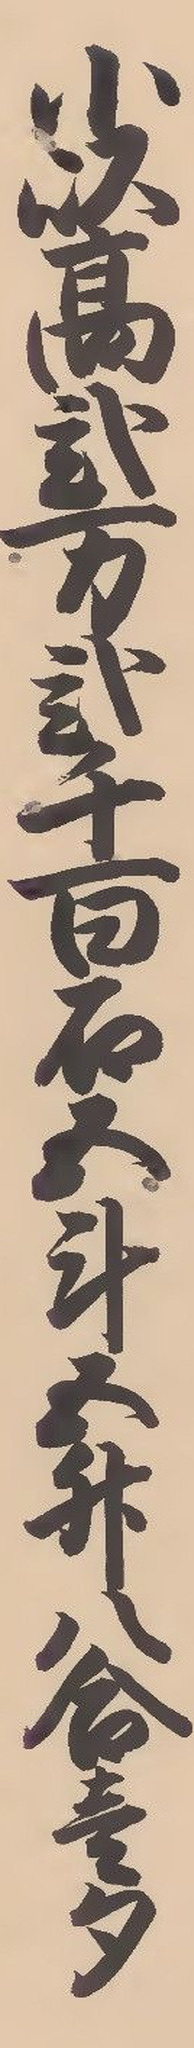小以高弐万弐千百石五斗五升八合壱勺

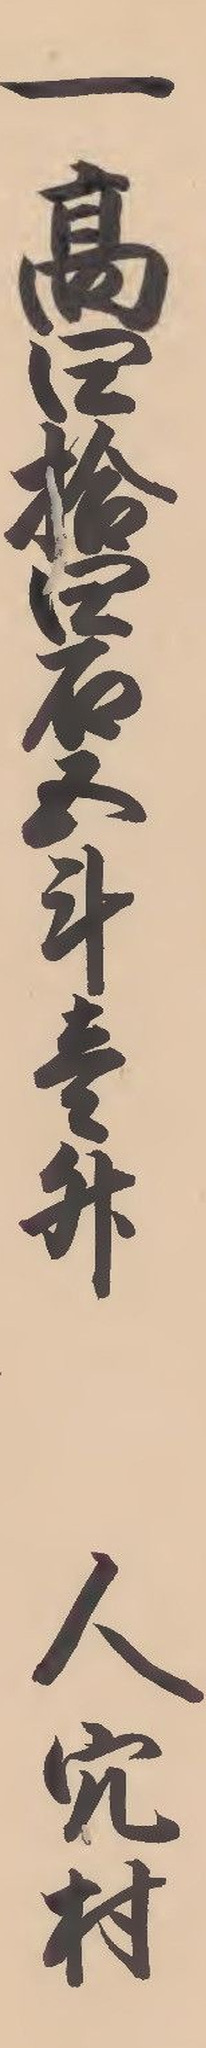一高四拾四石五斗壱升人穴村
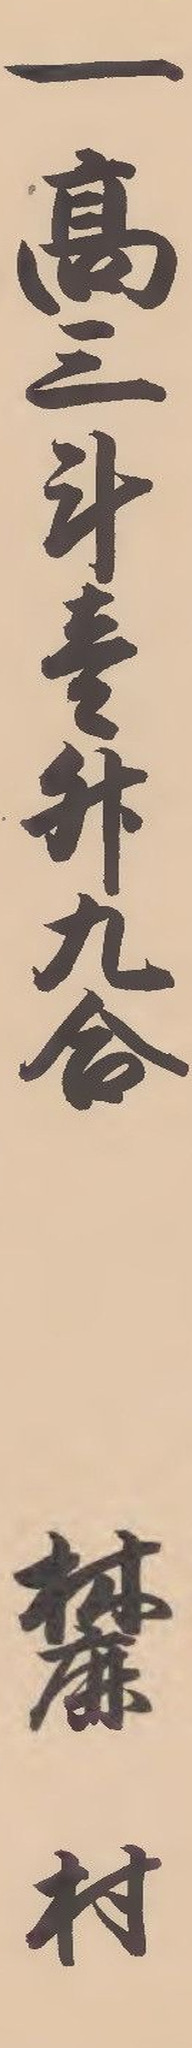一高三斗壱升九合麓村
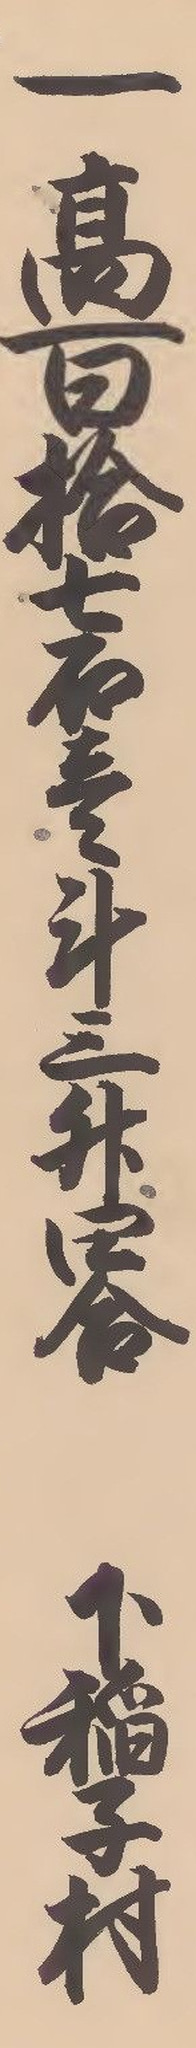一高百拾七石壱斗三升四合下稲子村

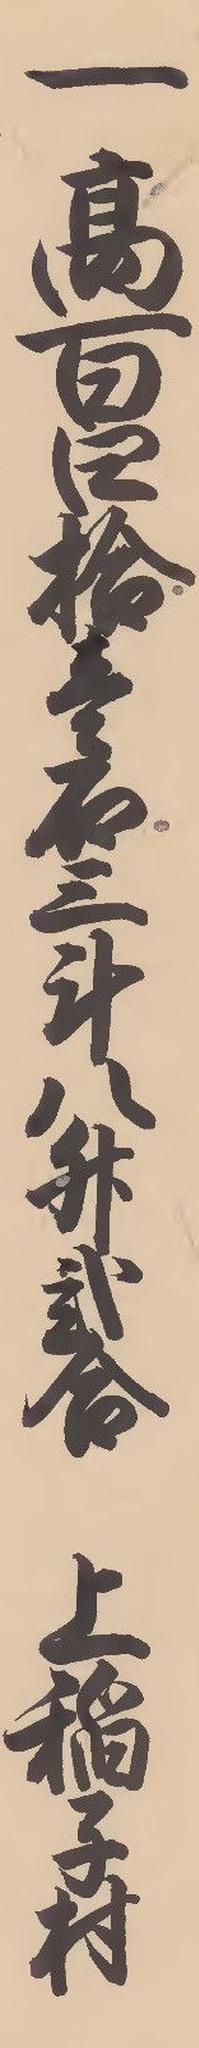一高百四拾壱石三斗八升弐合上稲子村
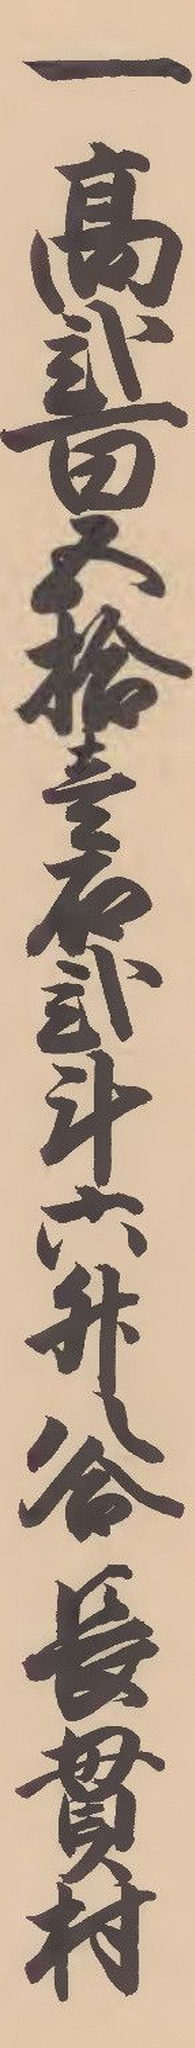一高弐百五拾壱石弐斗六升八合長貫村
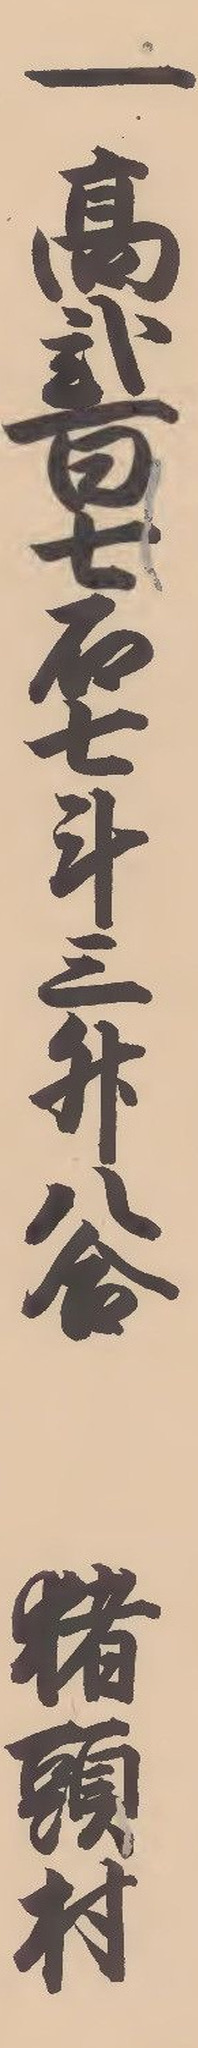一高弐百七石七斗三升八合猪頭村
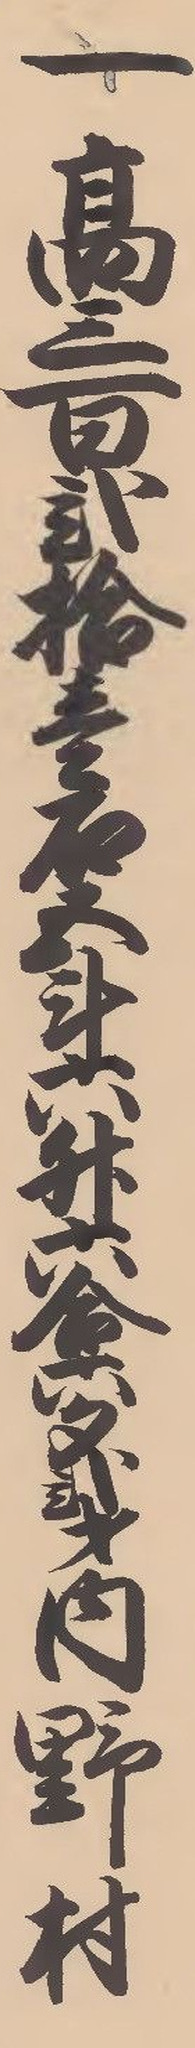一高三百弐拾壱石五斗六升六合六勺弐才内野村
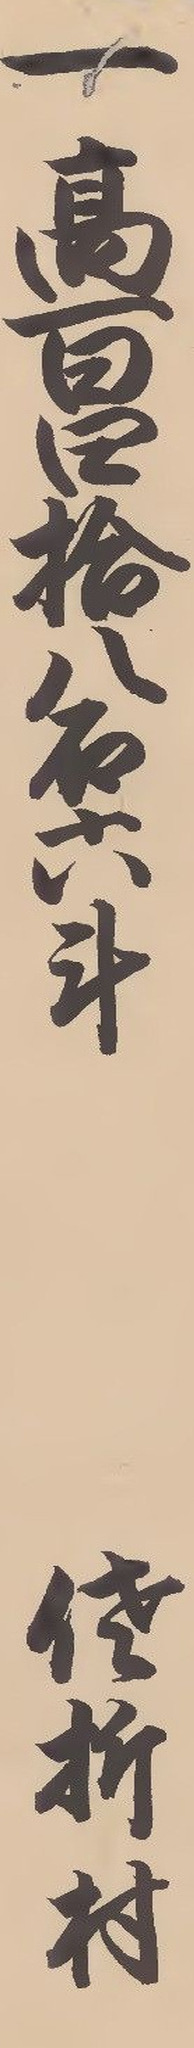一高百四拾八石六斗佐折村
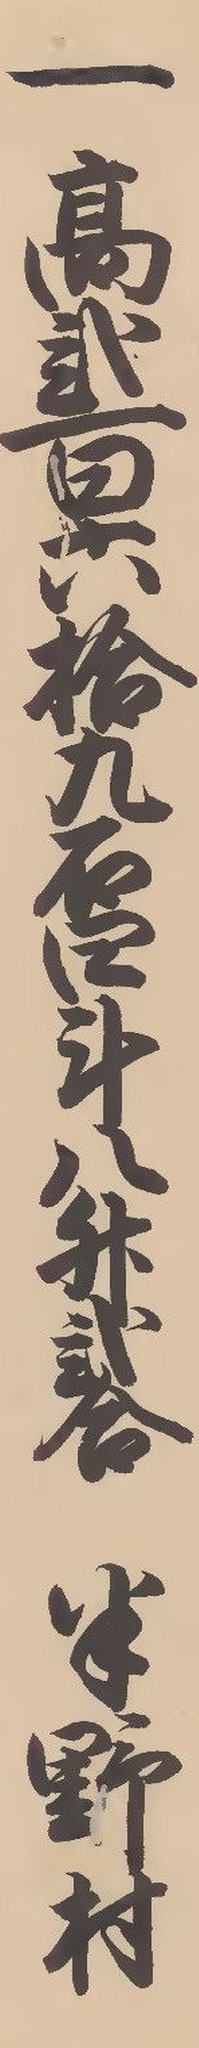一高弐百六拾九石四斗八升弐合半野村
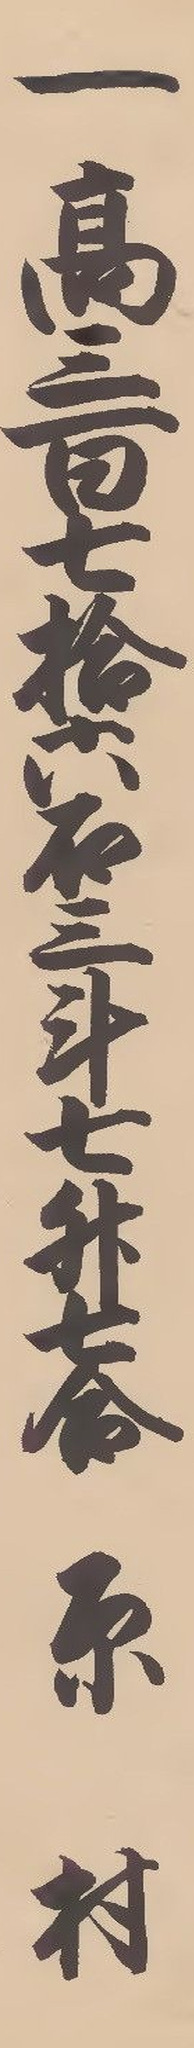一高三百七拾六石三斗七升七合原村
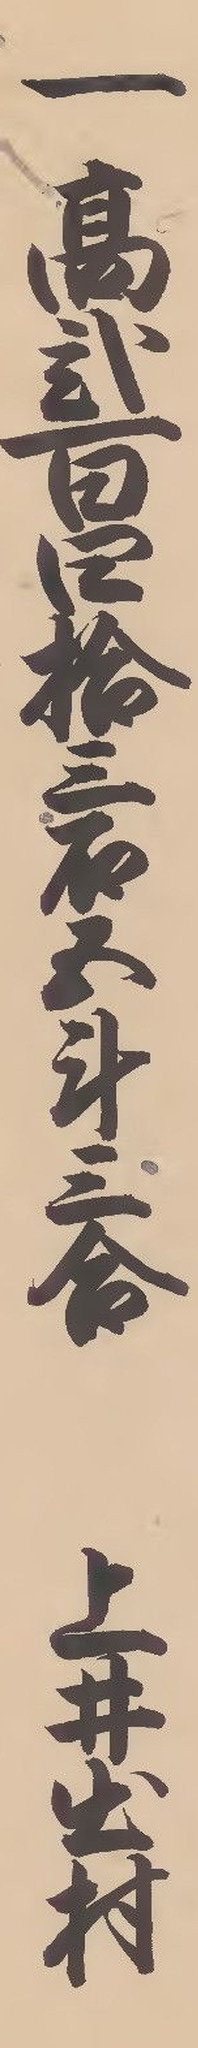一高弐百四拾三石五斗三合上井出村

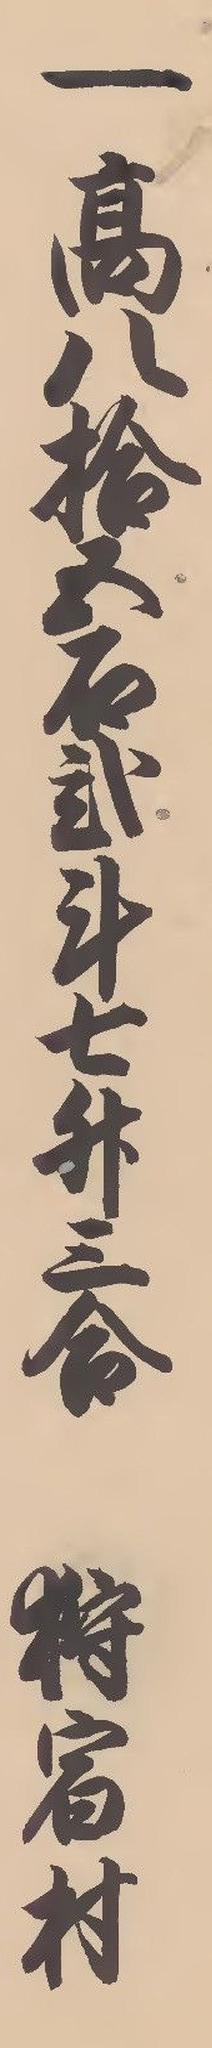一高八拾五石弐斗七升三合狩宿村
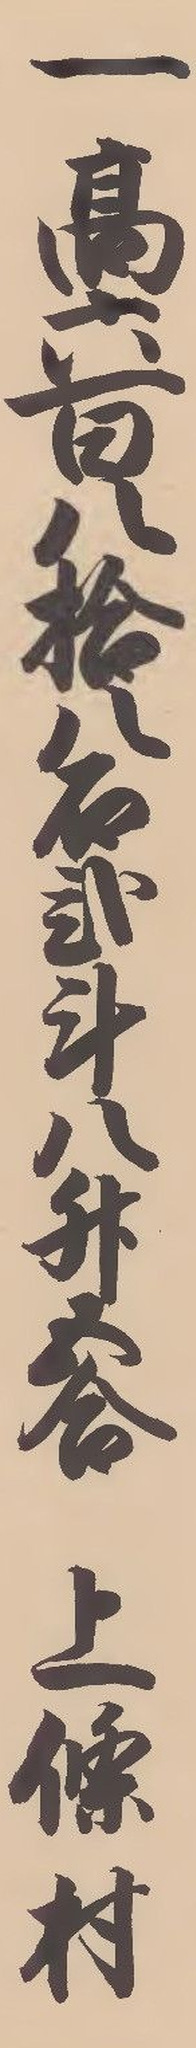一高六百八拾八石弐斗八升五合上条村
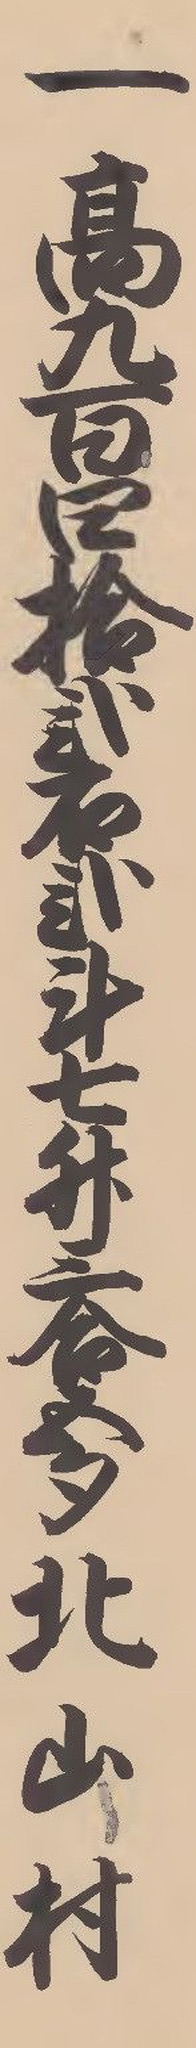一高九百四拾弐石弐斗七升三合五勺北山村
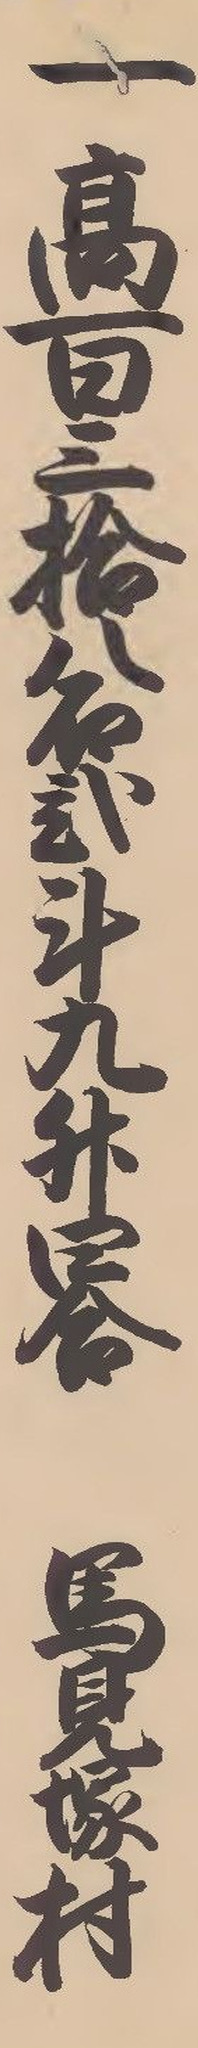一高百三拾八石弐斗九升四合馬見塚村
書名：駿河国郷帳
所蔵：国立公文書館 National Archives of Japan
